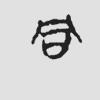同
